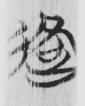{辶各}
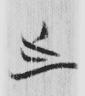之
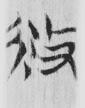{彳水攴}
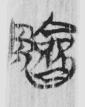險
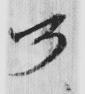乃
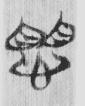{䀠心}
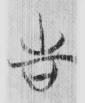告
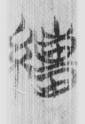糸山=
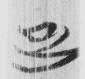疋
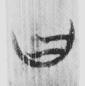曰
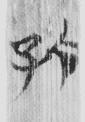孤
